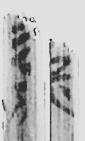庶
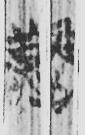戁（難）
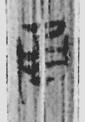甬
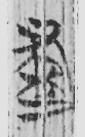建
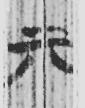亓
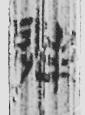邦
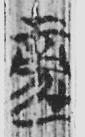坪
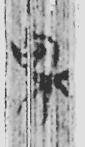和
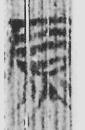庶
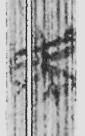民
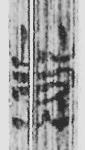莫
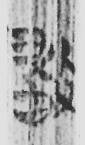敢
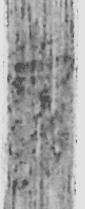○（穫）
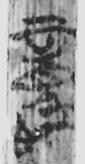憧
